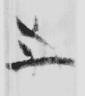之
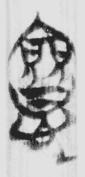憸
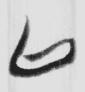㠯（以）
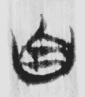自
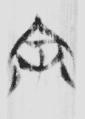余
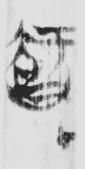智
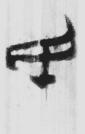民
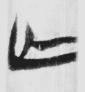亡
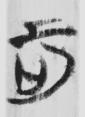可
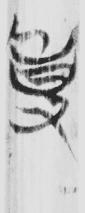事
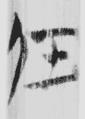任
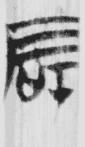砫
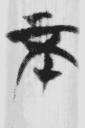不
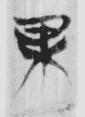果
